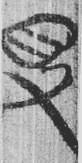○（得）
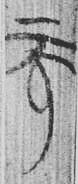而
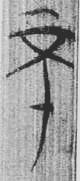不
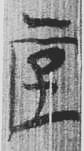危（詭）
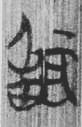䎽（問）
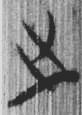之
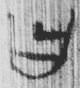曰
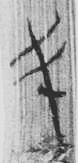民
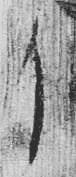人
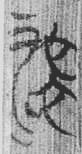流
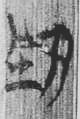型（形）
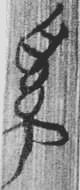○（奚）
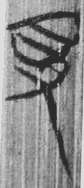○（得）
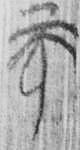而
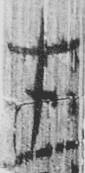生
